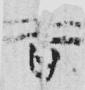吉
